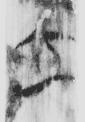立
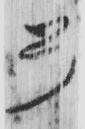乃
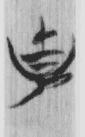克
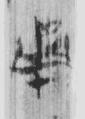甬
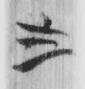之
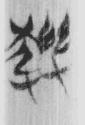彝
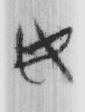女
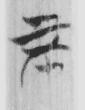不
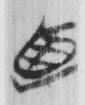廼
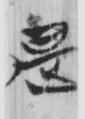是
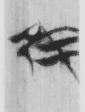隹
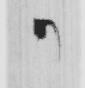人
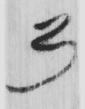乃
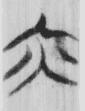亦
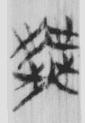無
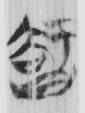智
